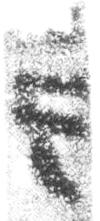行
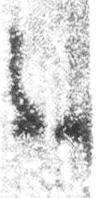之
